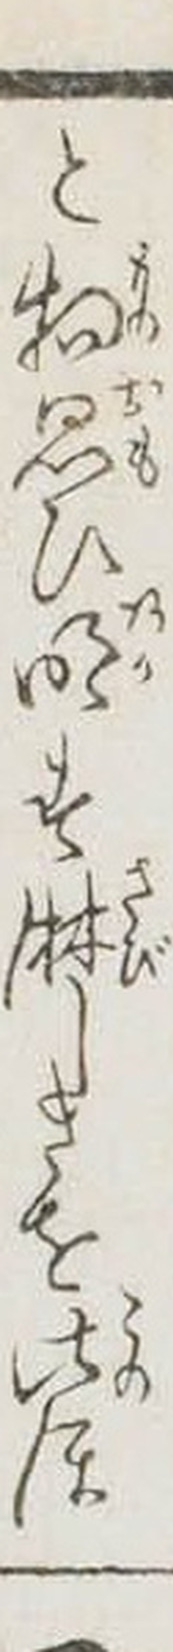と物思ひ明す淋しさを此ほ
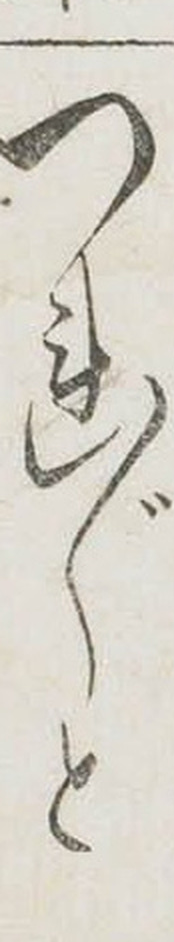つれ〴〵と
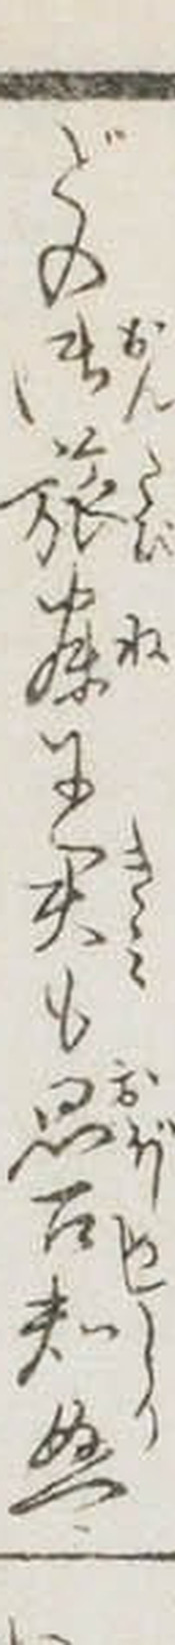どの御旅寐に君も思召知ぬ
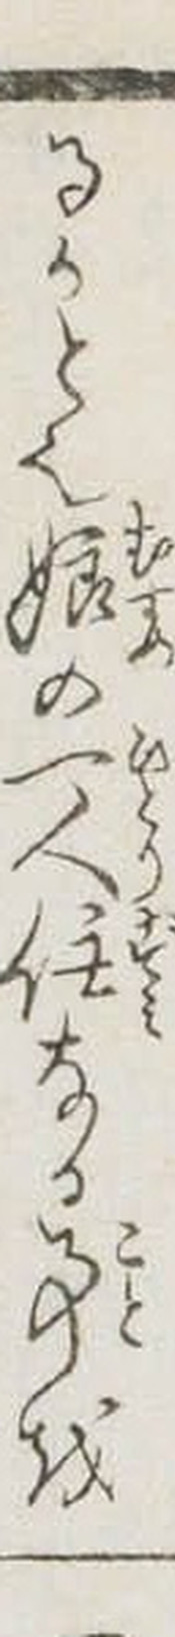事かと也娘の一人住なる事を
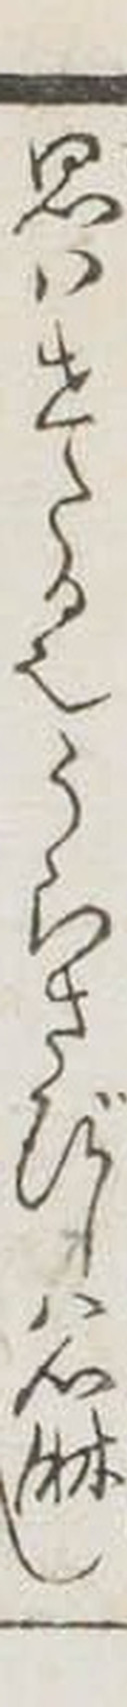思はせたる也うらさびしは心淋し
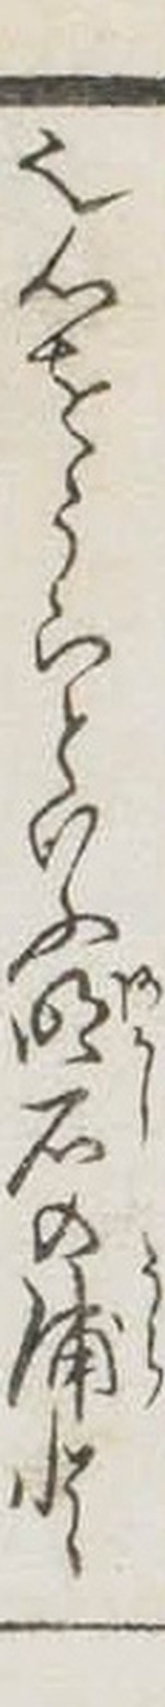也心をうらといふ明石の浦と
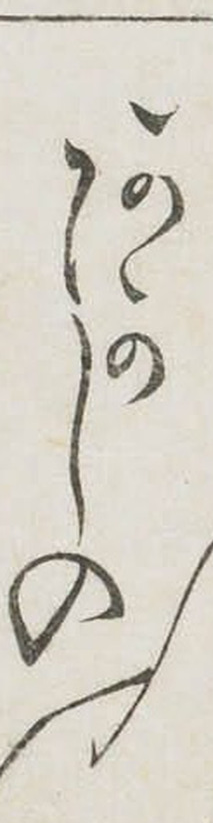あかしの
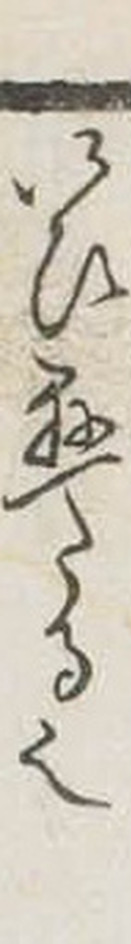いひ懸たる也
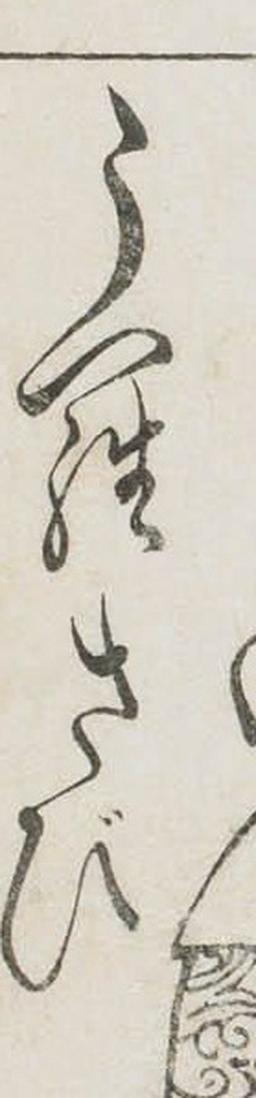うらさび
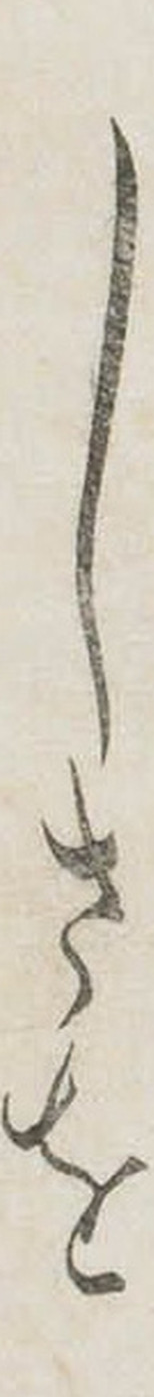しさを

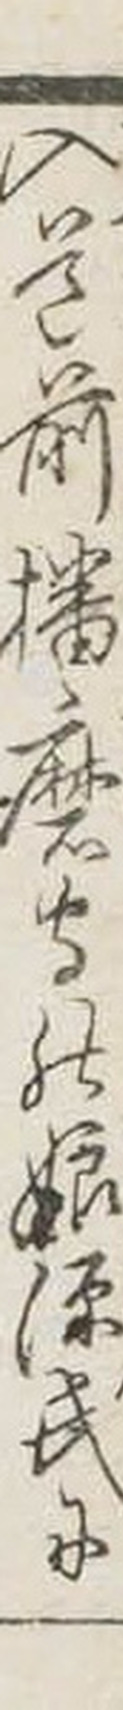入道前播磨守の娘源氏に
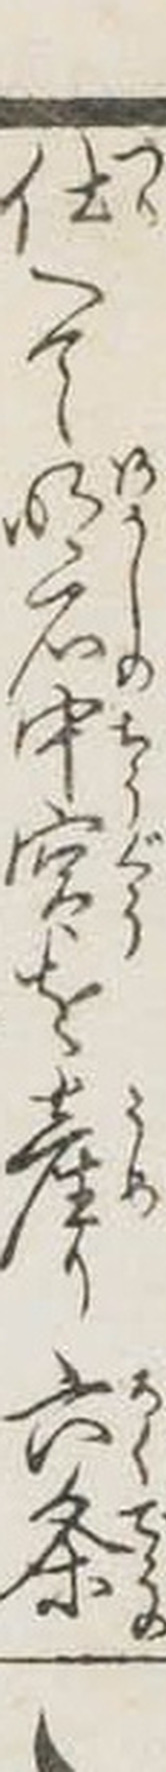仕へて明石中宮を産り六条
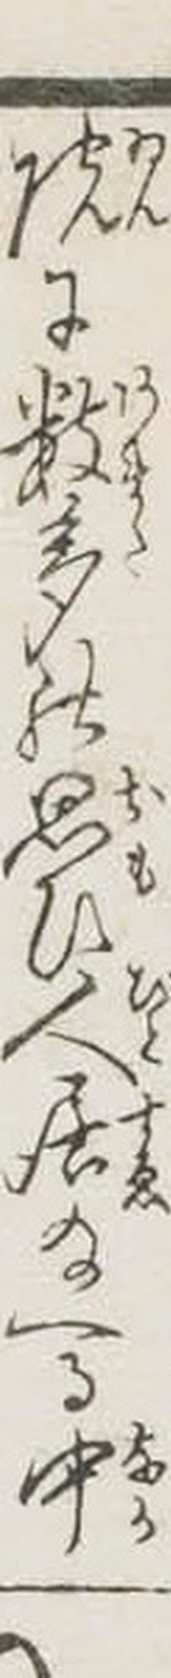院に数多の思ひ人居給へる中
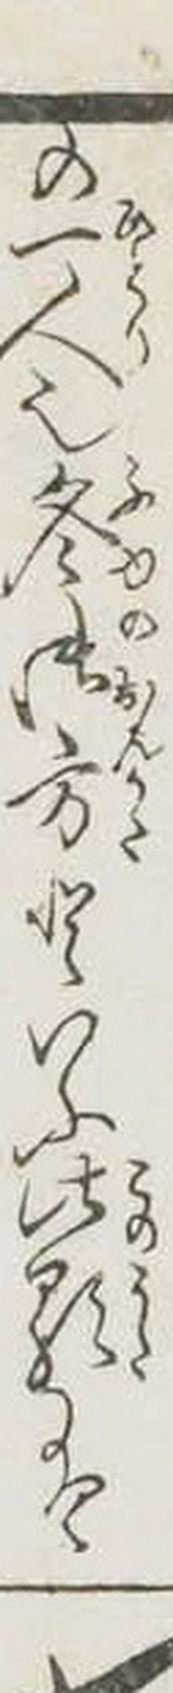の一人也冬御方といふ此歌は
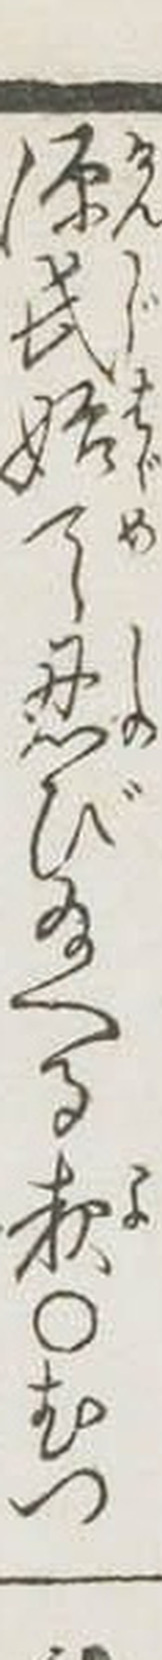源氏始て忍び給へる夜○むつ
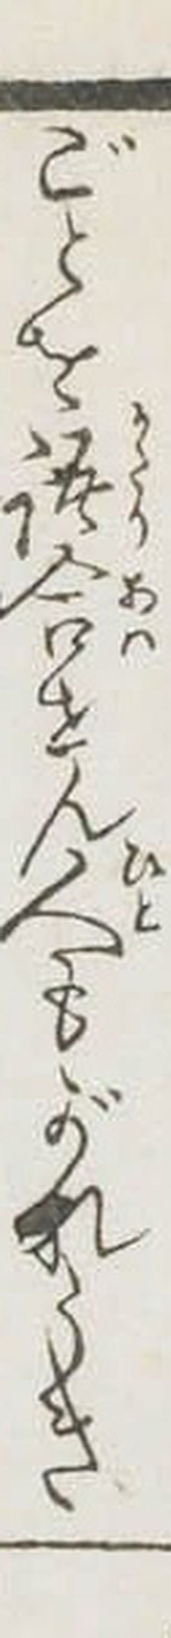ごとを語合せん人もがなうき
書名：源氏百人一首
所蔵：東京学芸大学教育コンテンツアーカイブ
